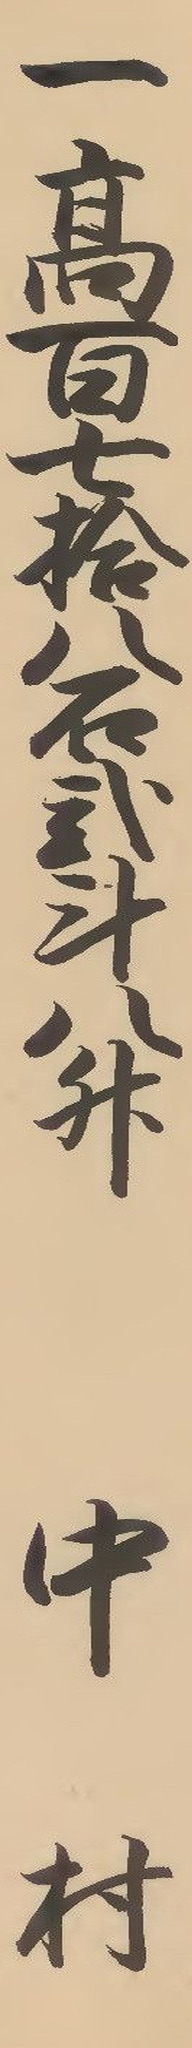一髙百七拾八石弐斗八升中村
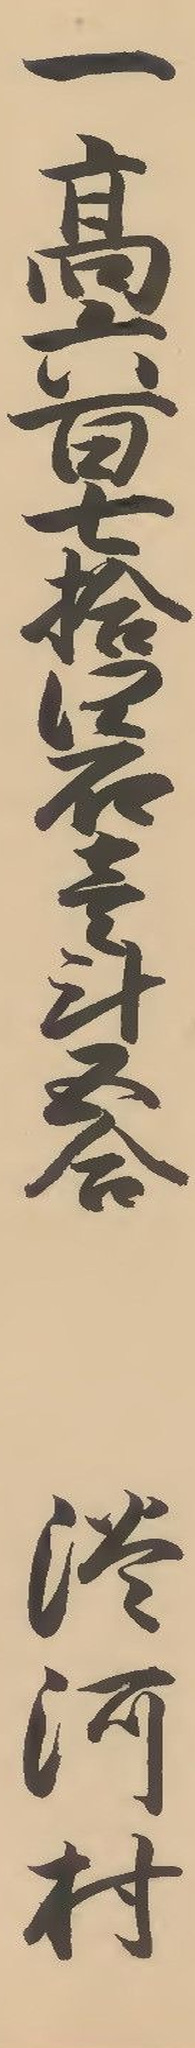一髙六百七拾四石壱斗五合淡河村
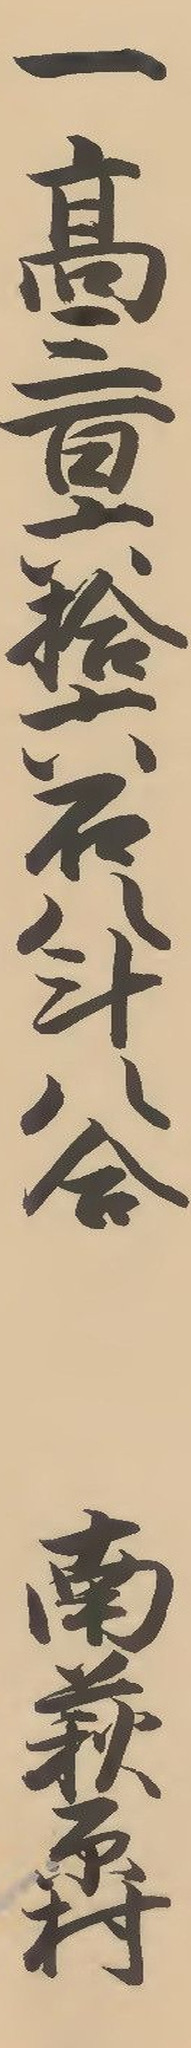一髙三百六拾六石八斗八合南萩原村

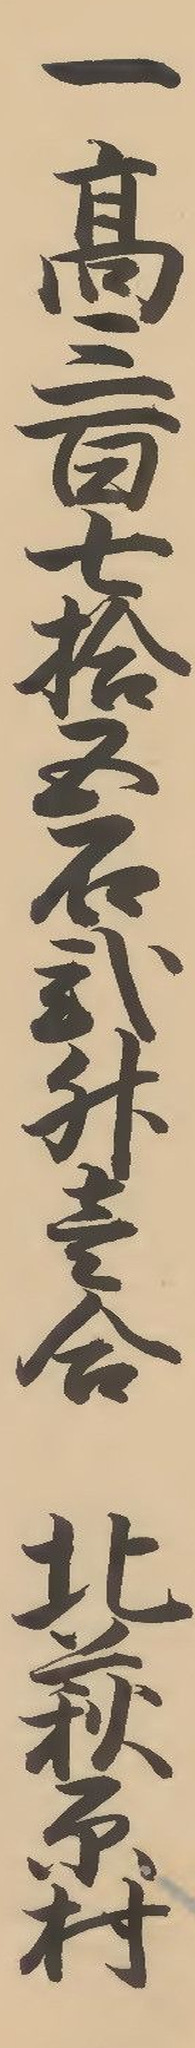一髙三百七拾五石弐升壱合北萩原村
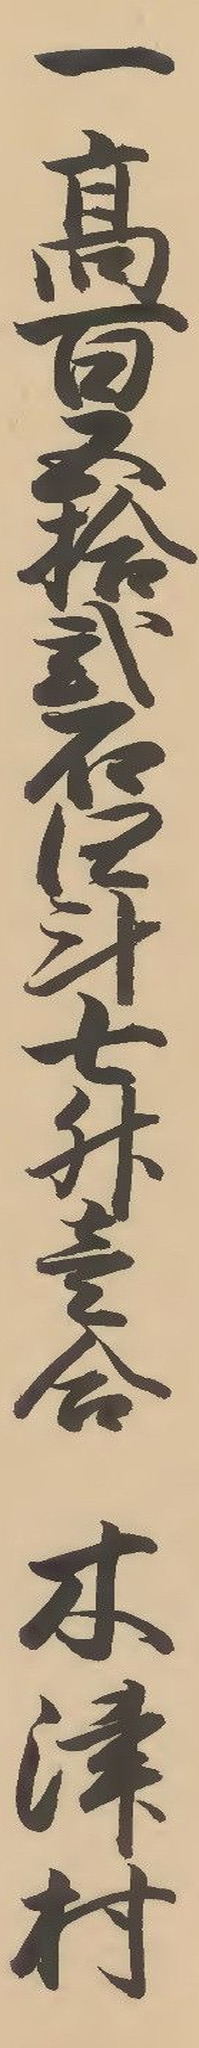一髙百五拾弐石四斗七升壱合木津村
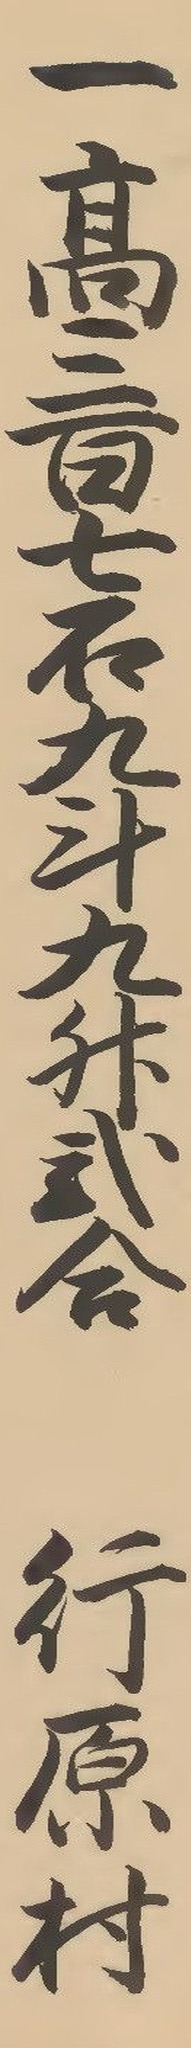一髙三百七石九斗九升弐合行原村
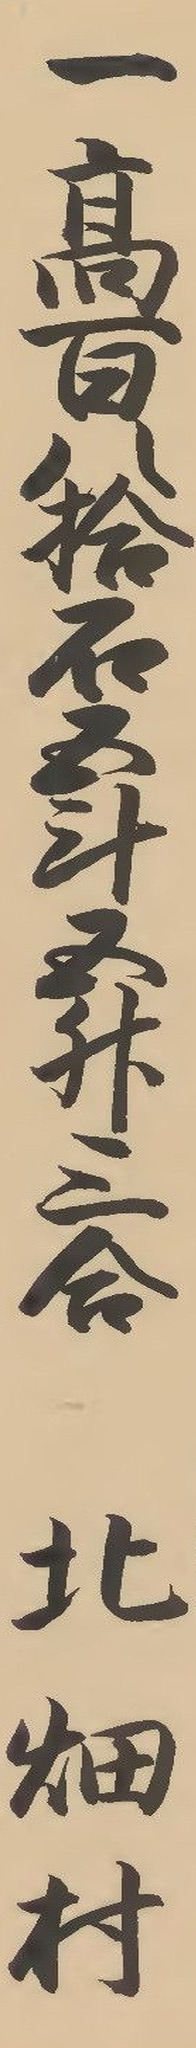一髙百八拾石五斗五升三合北畑村
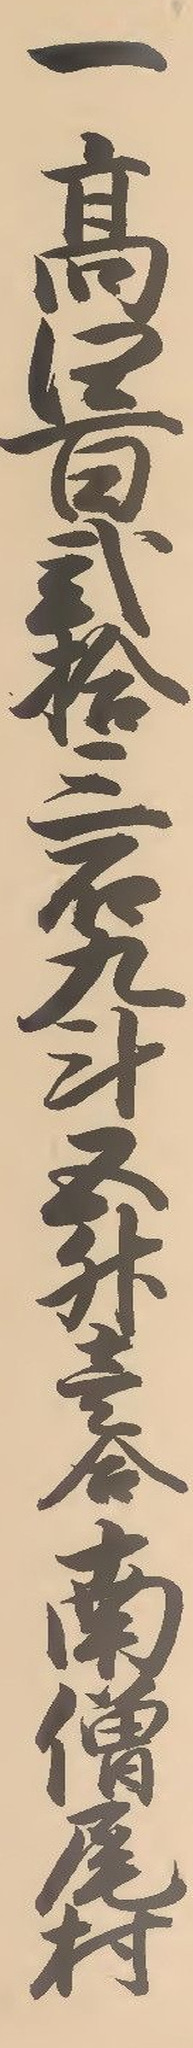一髙四百弐拾三石九斗五升壱合南僧尾村
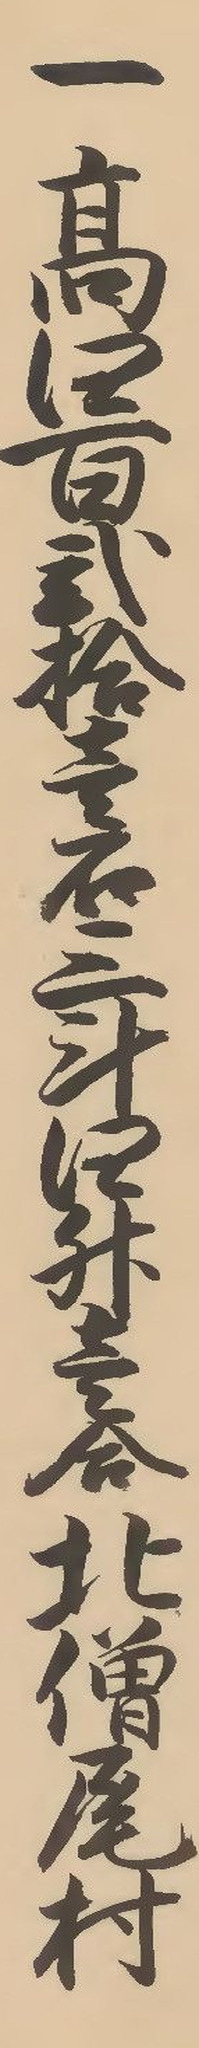一髙四百弐拾壱石三斗四升壱合北僧尾村
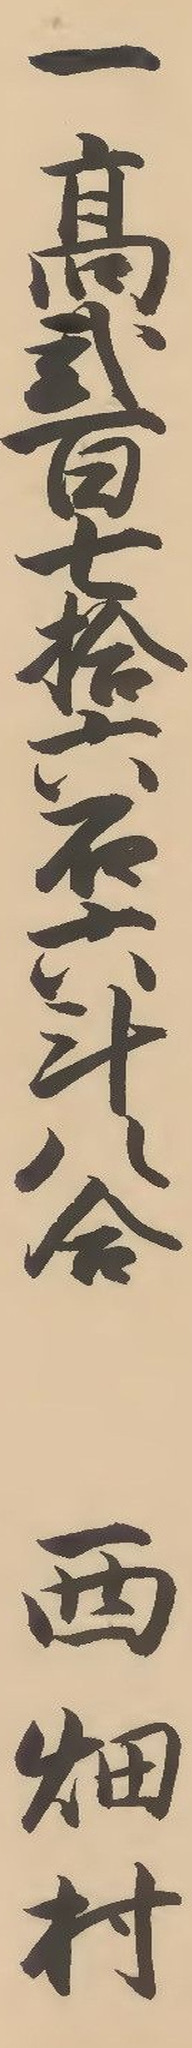一髙弐百七拾六石六升八合西畑村
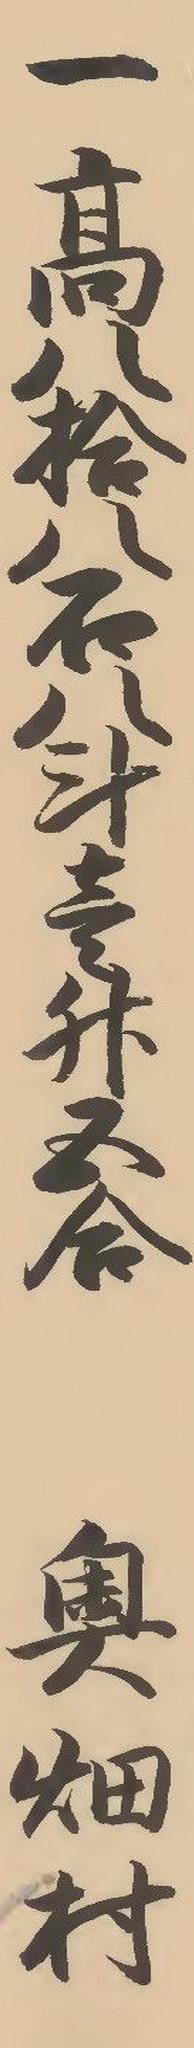一髙八拾八石八斗壱升五合奥畑村

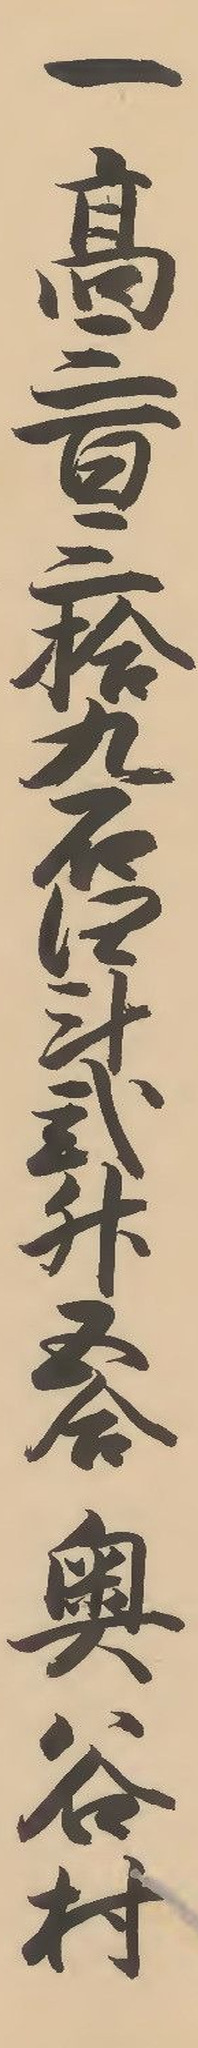一髙三百三拾九石四斗弐升五合奥谷村
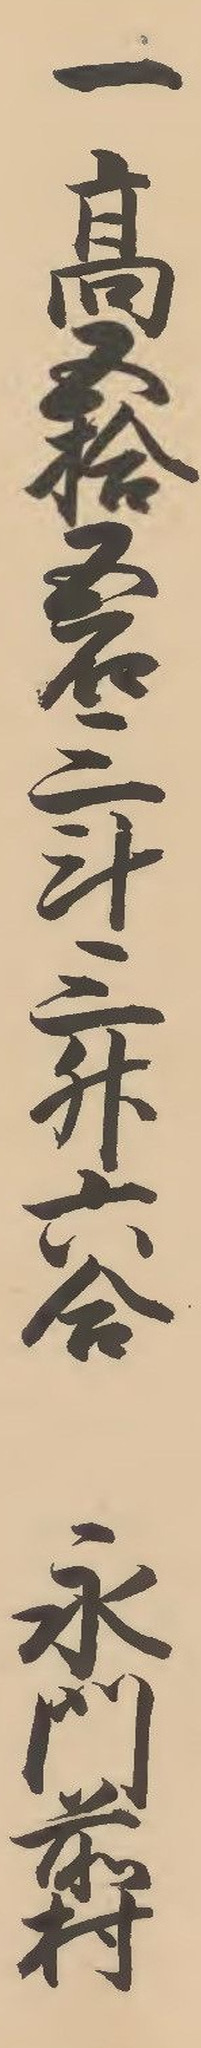一髙五拾五石三斗三升六合永門前村
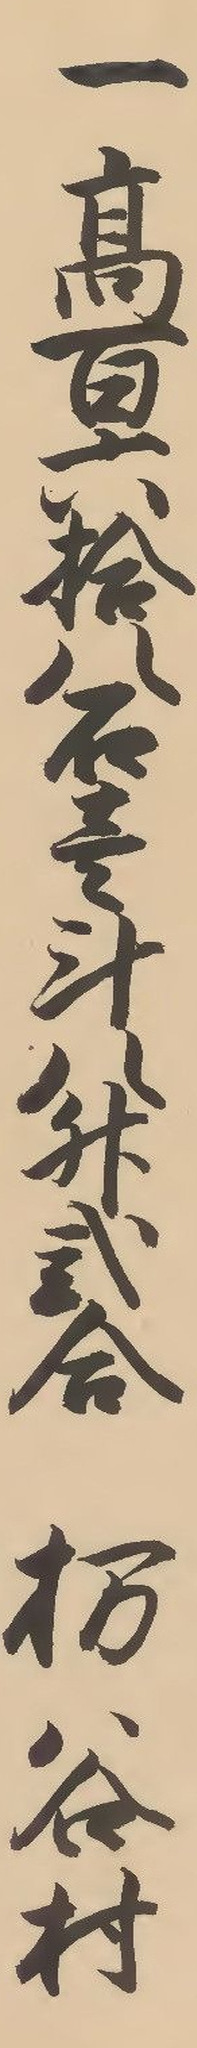一髙百六拾八石壱斗八升弐合杤谷村
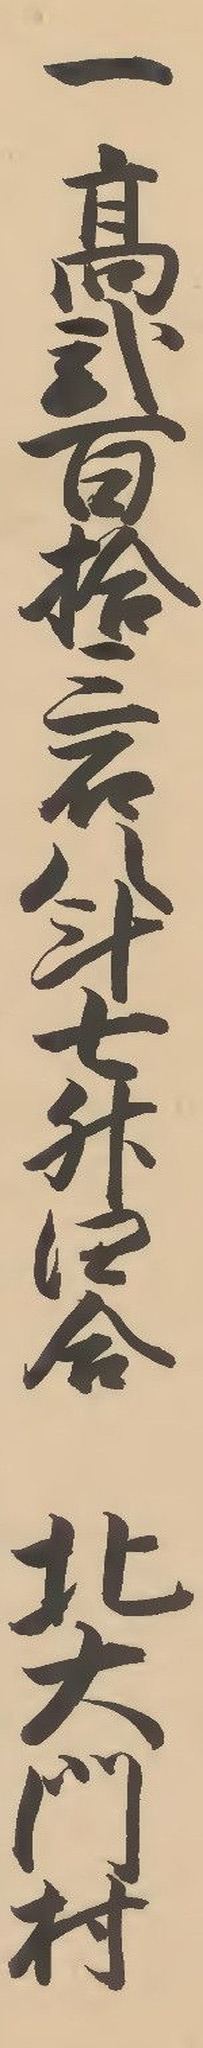一髙弐百拾三石八斗七升四合北大門村
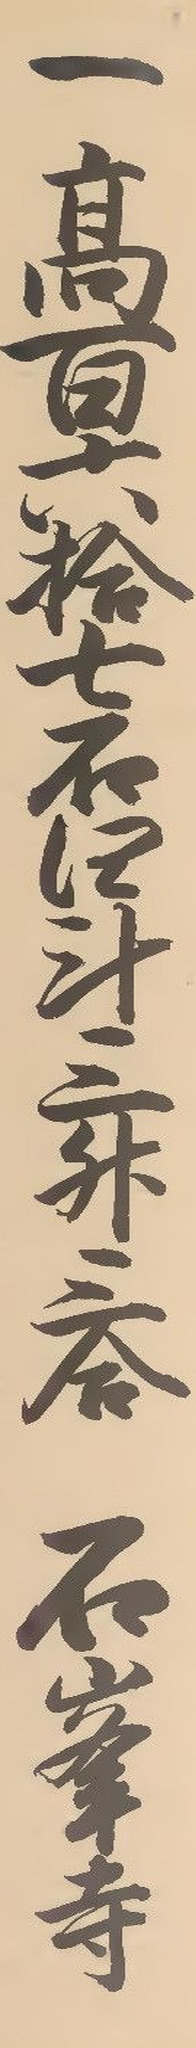一髙百六拾七石四斗三升三合石峯寺
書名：播磨国郷帳
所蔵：国立公文書館 National Archives of Japan
